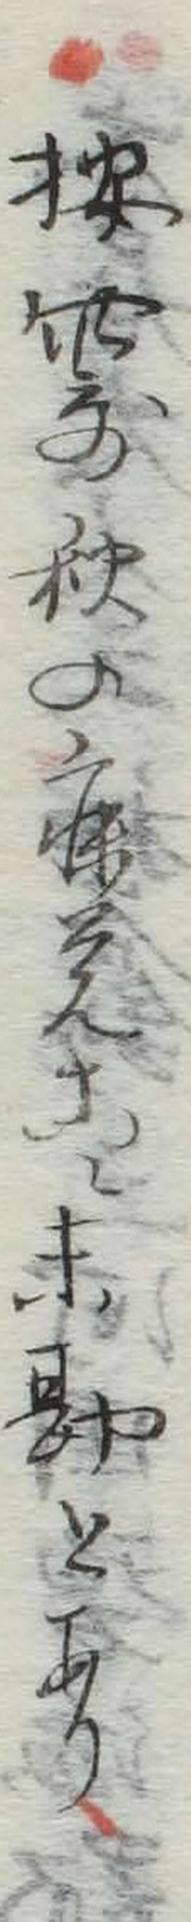●按此歌秋の寝覚等ニ未勘とあり、
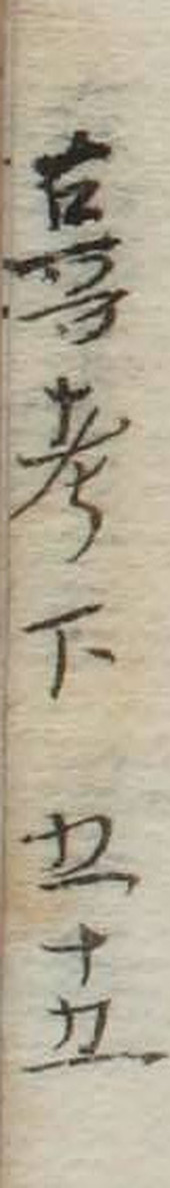古歌考下五十五

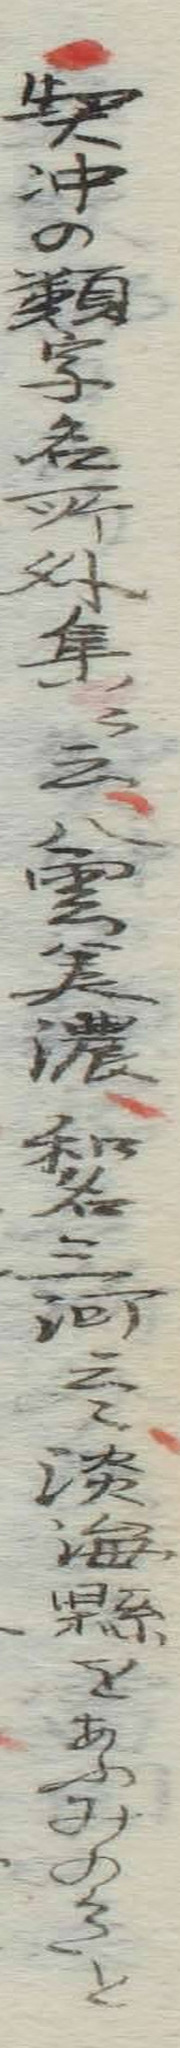○依網原●契冲の類字名所外集ニ云、八雲美濃、和名三河云々、淡海縣をあふみのかたと
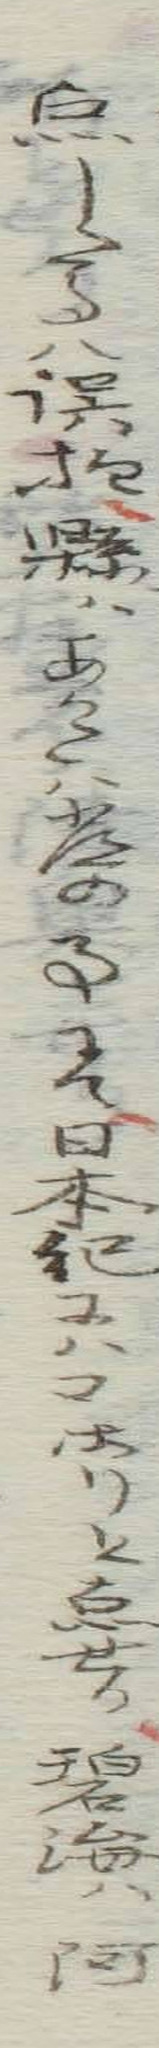点したるは誤歟、縣はあかたは常の事にて、日本記にはコホリと点せり、碧海は阿
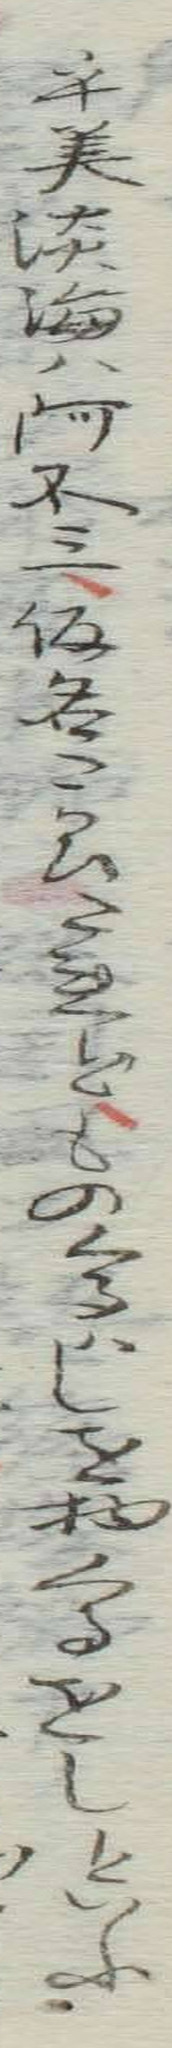乎美淡海は阿不三、仮名たかひたれど、ものくるはしを物くるをしといふ
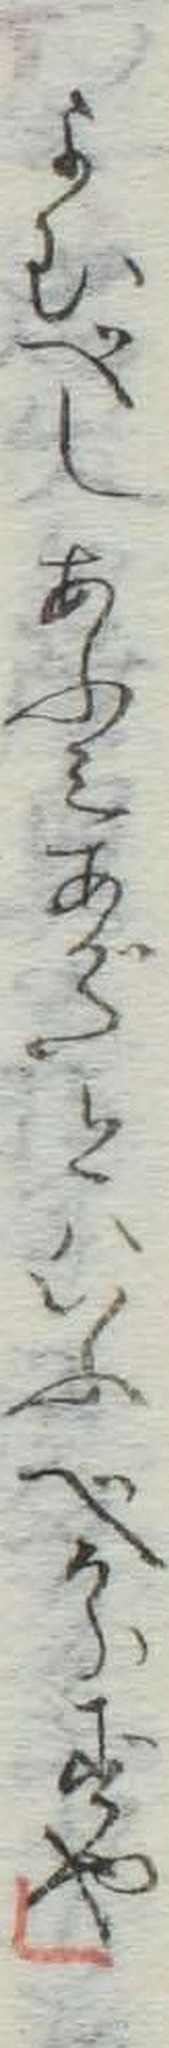よむべしあふみあがたといふべからすや」
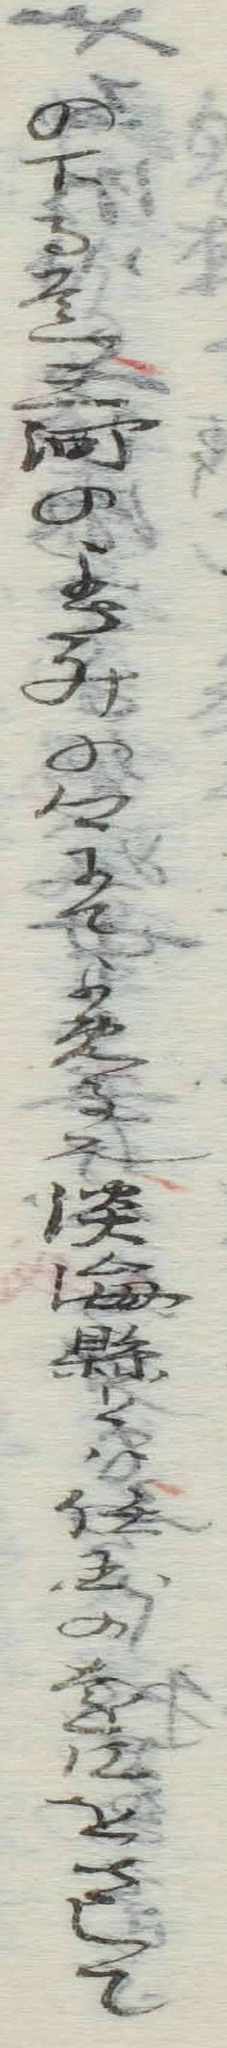の下る道、三河のよさみの郷にてよめる也、淡海縣とは、任国の遠江をさして
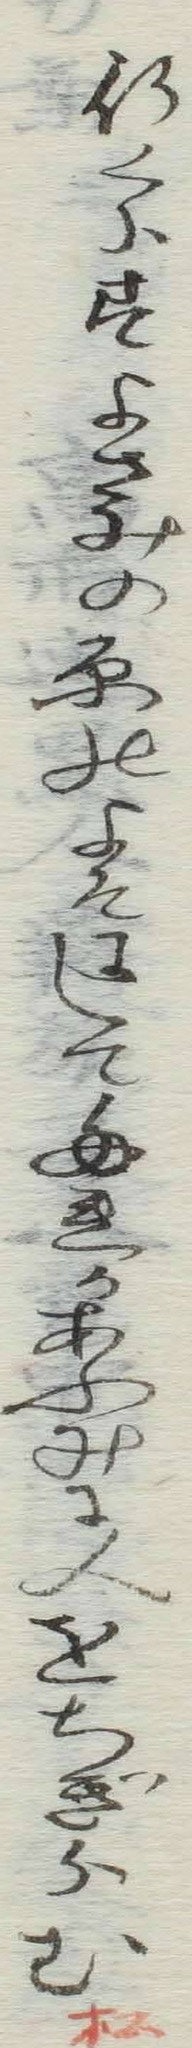行くらすよさみの原のよそにしてたれかあふみに人をちぎらむ松
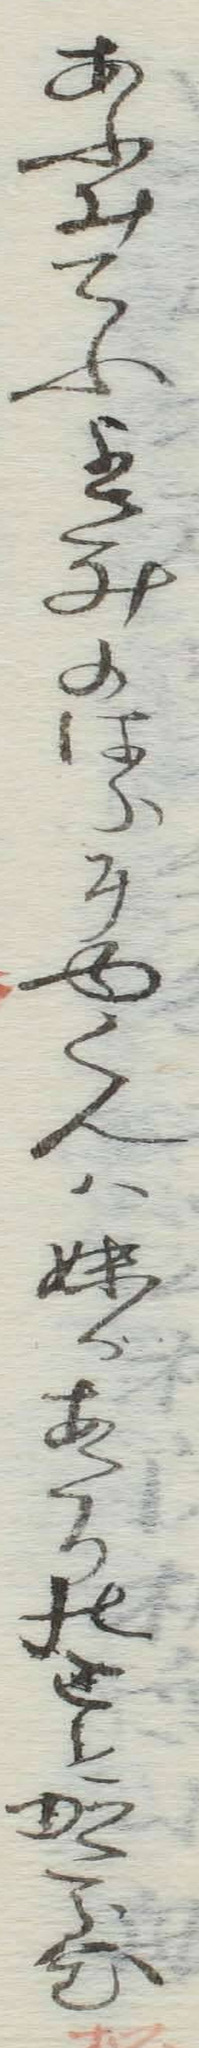あふみてふよさみのはらにゆく人は妹があたりのことかたらむ松
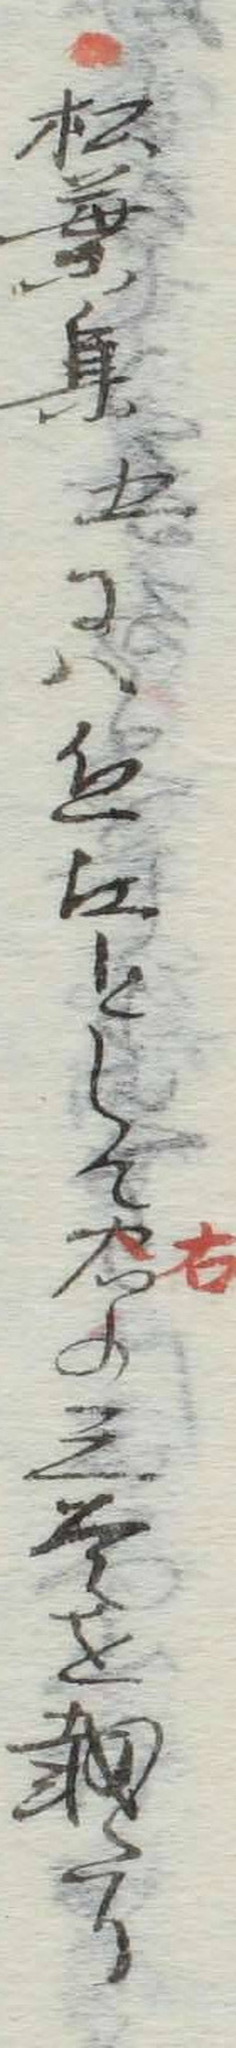●松葉集五には近江として右の三首を載たり
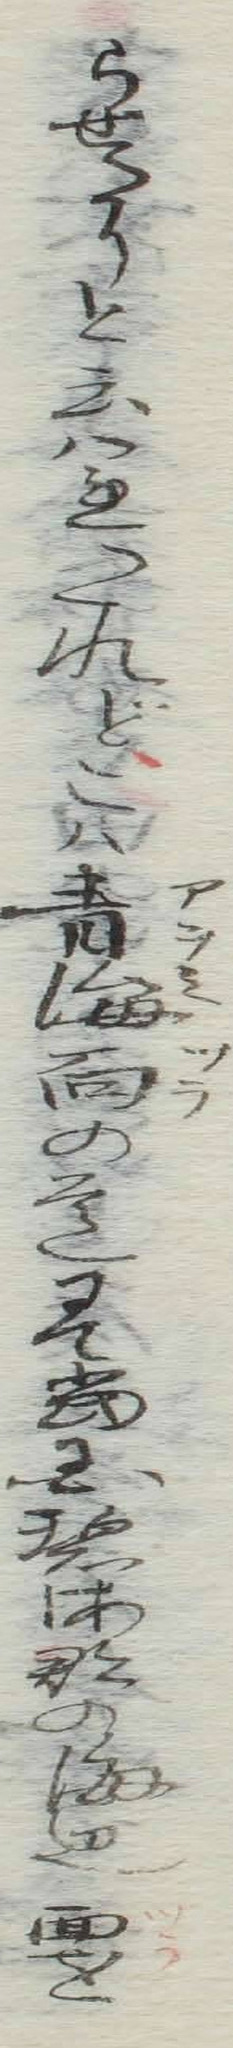らせたりと云はれたれど、こは青海面の意にて当国碧海郡の海辺面を
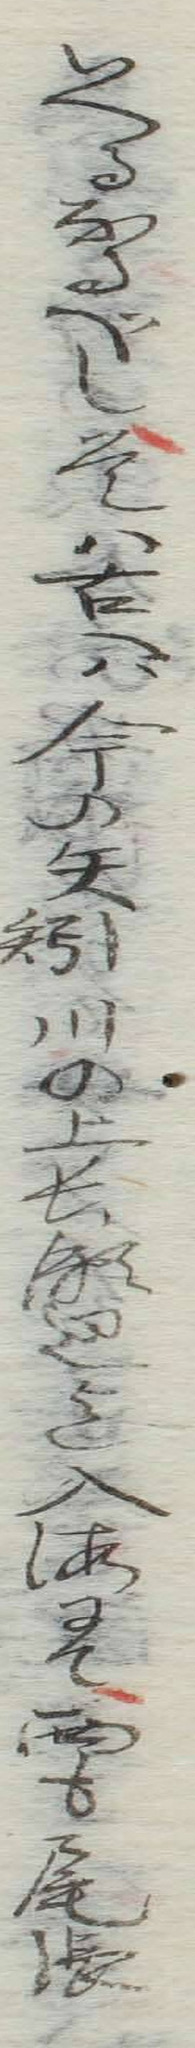いへるなるべし、是は古へは今の矢矧川の上長瀬辺迄入海にて、西も尾張
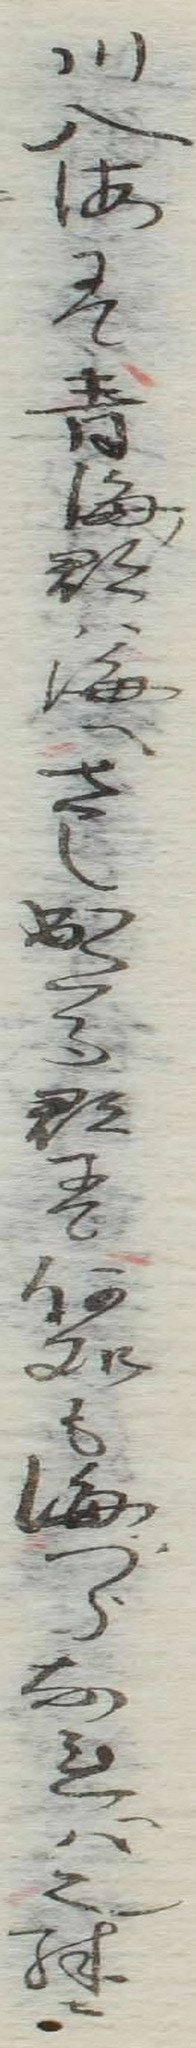川入海にて、青海郡は海へさし出たる郡にて、何処も海づらなれば也殊ニ

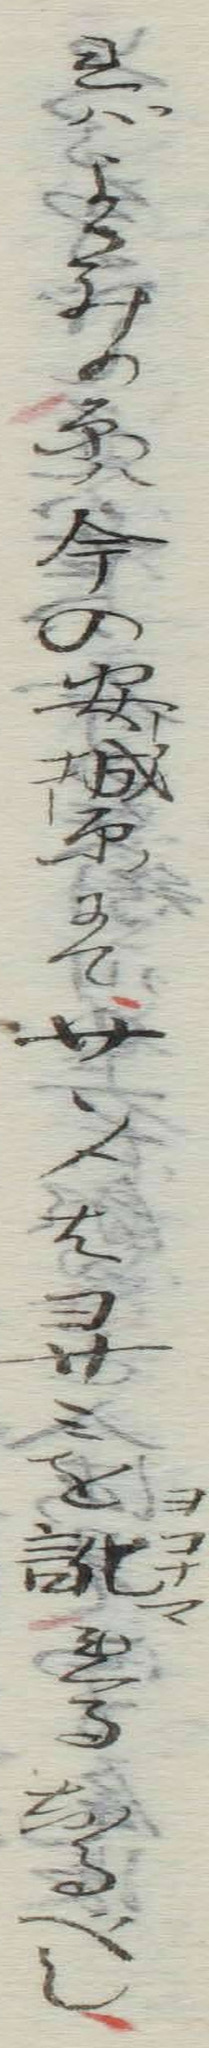ればよさみの原は今の安‾城_原にて、サヽメはヨサミを訛れるなるべし、
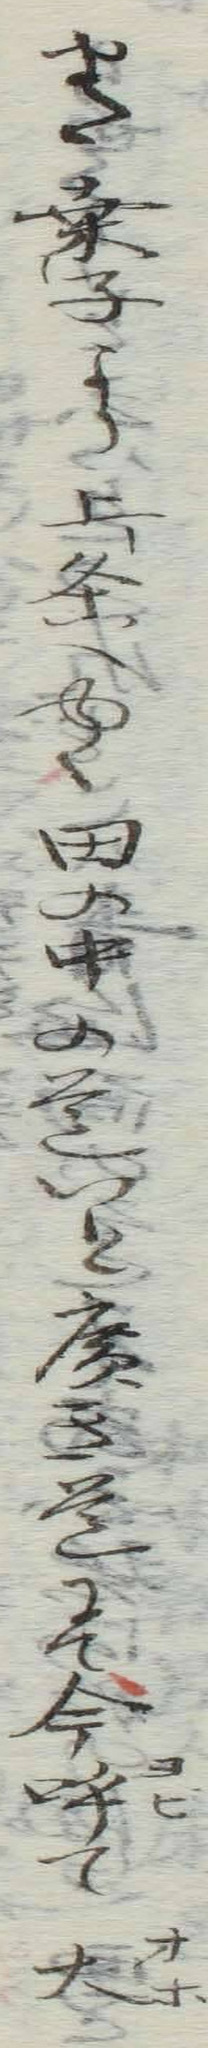また桑_子より上‾条へゆく田の中の道いと広き道にて、今呼て大
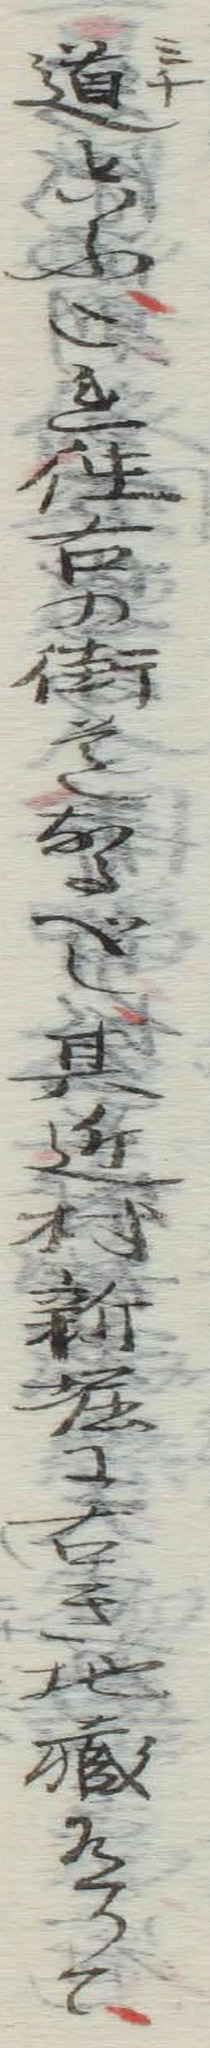道といふ、これ往古の街道なるべし、其近村新堀に古き地蔵有りて、
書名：三河国古跡考
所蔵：国文学研究資料館
